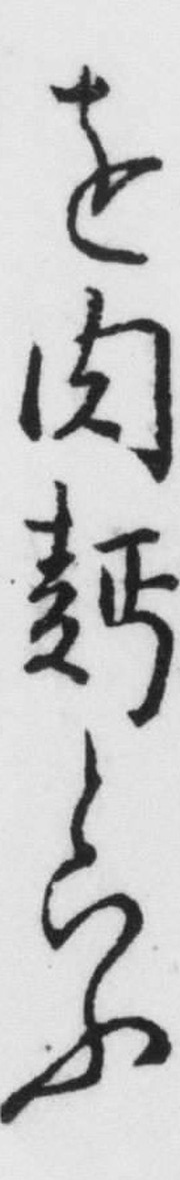を肉麺といふ

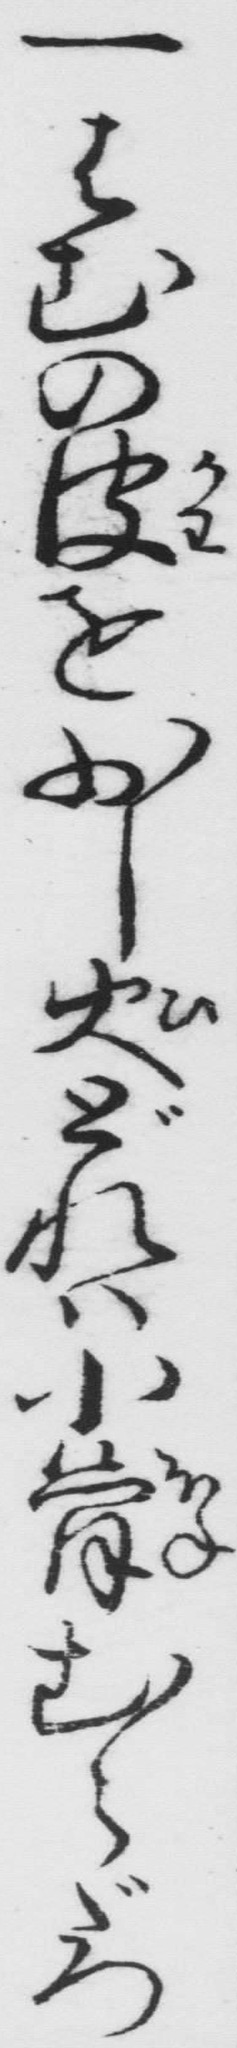一はむの皮を少し火どれは小骨むらだつ
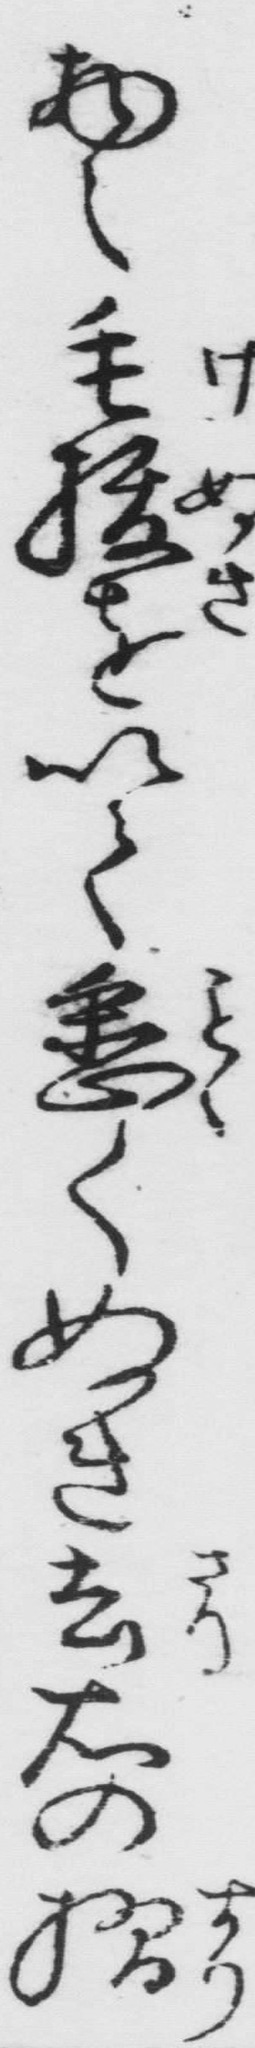物の毛抜を以て悉くぬき去右の摺
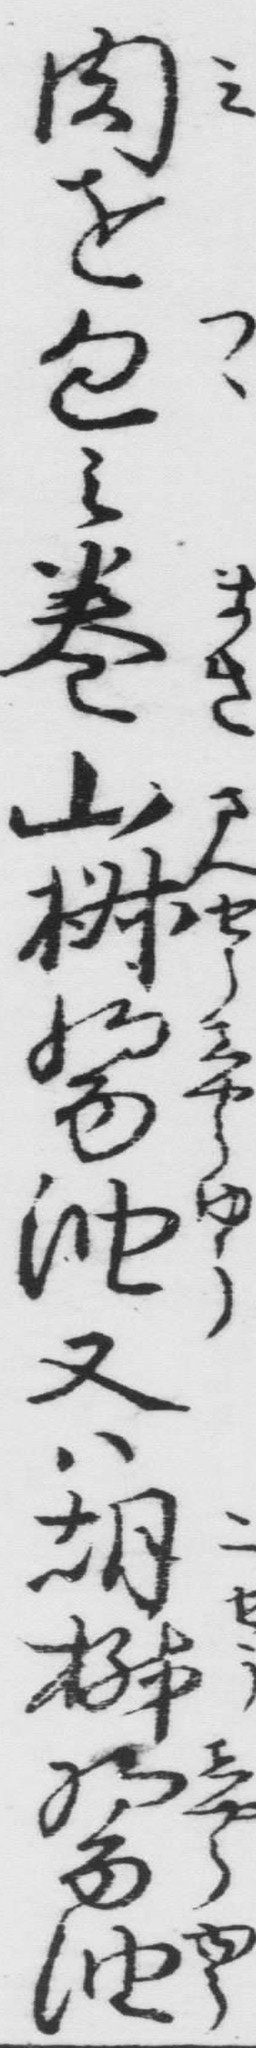肉を包み巻山椒醤油又は胡椒醤油
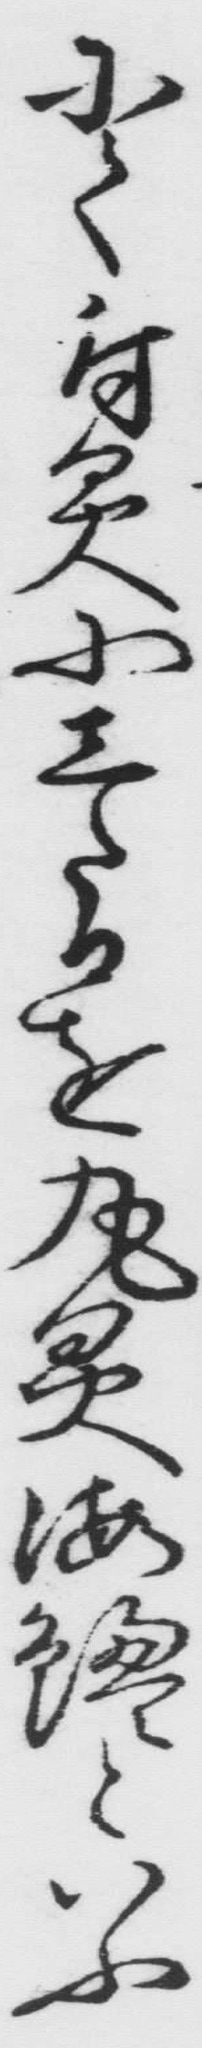にて付炙にしたるを丸炙海鱧といふ
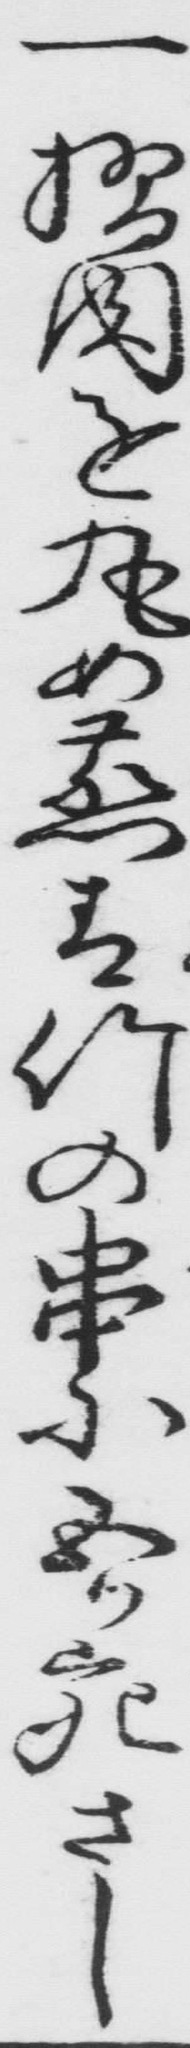一摺肉を丸め蒸青竹の串に五ツ宛さし
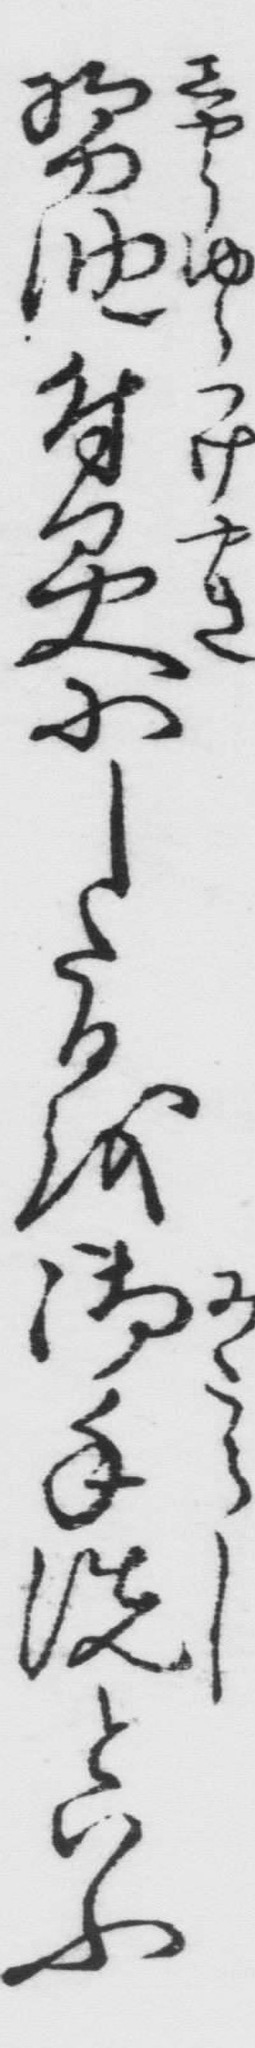醤油付炙にしたるを御手洗といふ
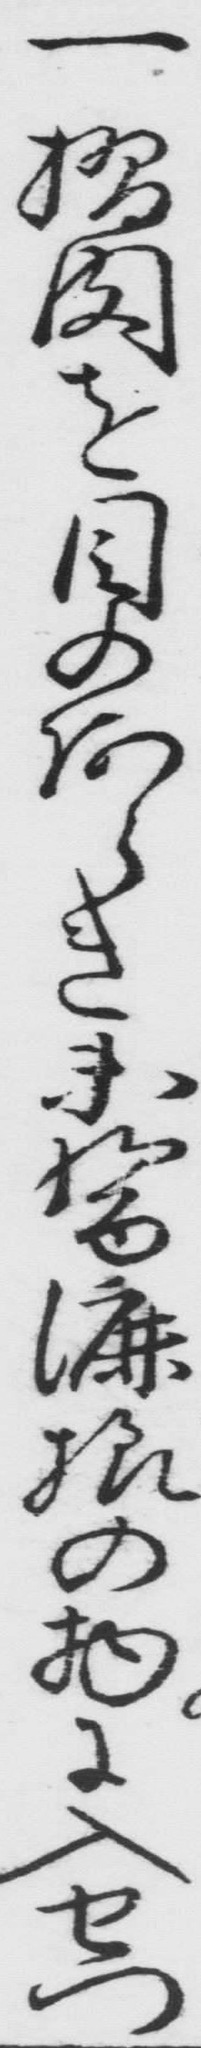一摺肉を目のあらき未醤漉様の物に入せつ

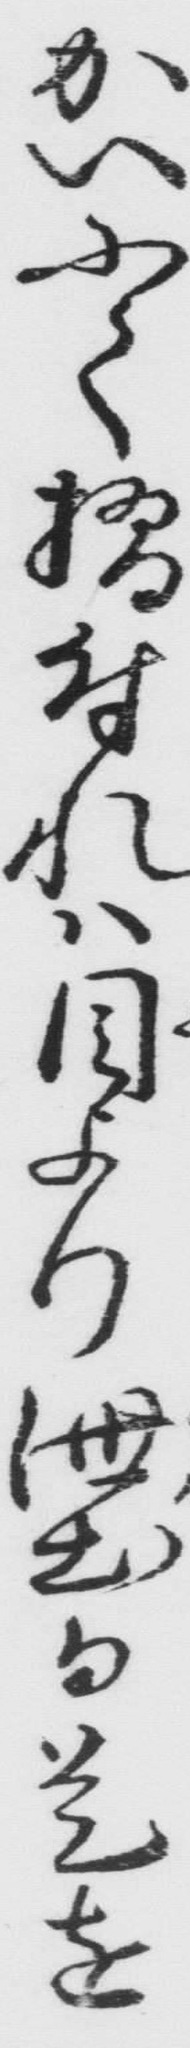かいにて摺付れは目より泄出る是を
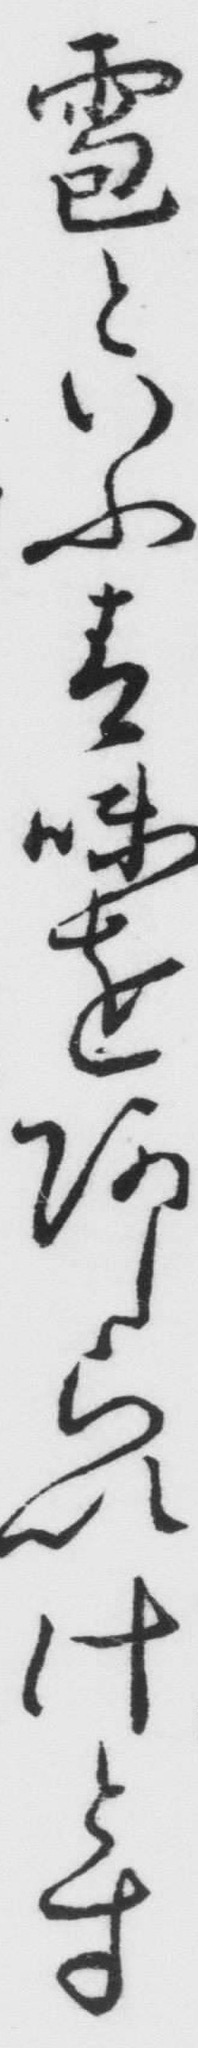雹といふ青味をあしらい汁とす
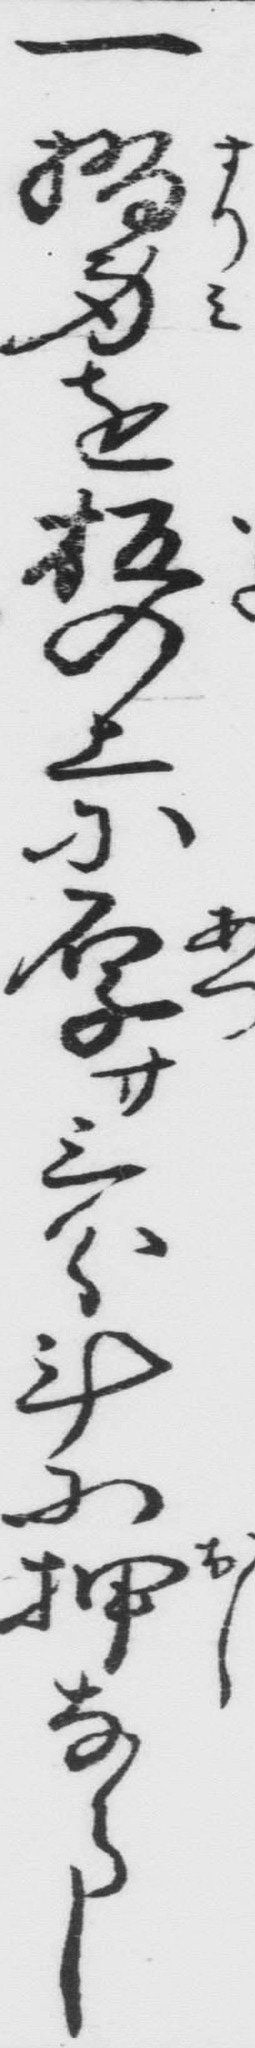一摺身を板の上に厚さ三分斗に押ならし
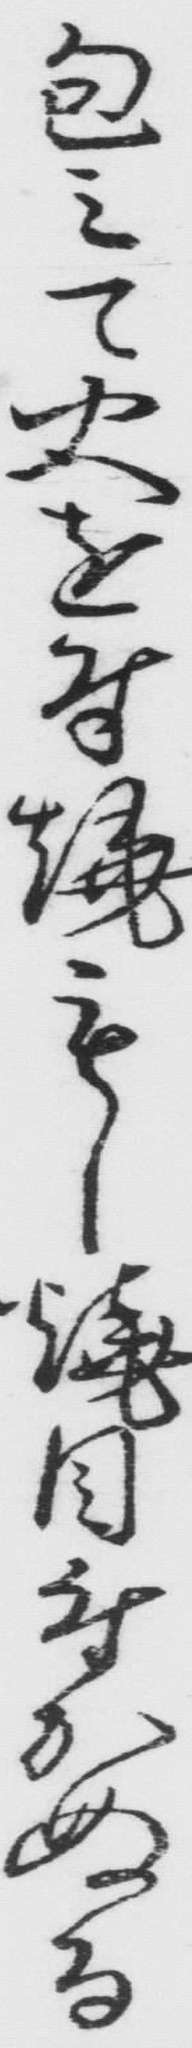包みて火を付燒もし燒目付かぬる
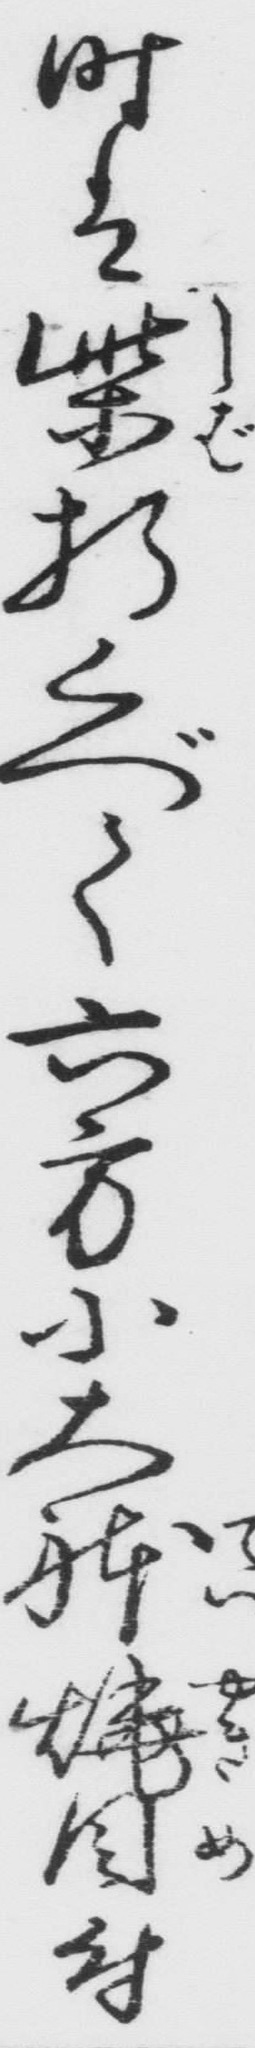時は柴折くべて六方に大躰燒目付
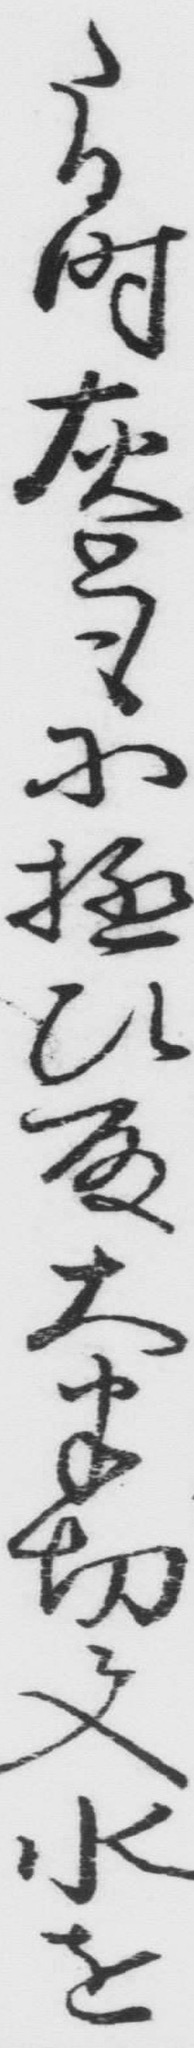たる時灰ともに拯ひ取大半切又水を

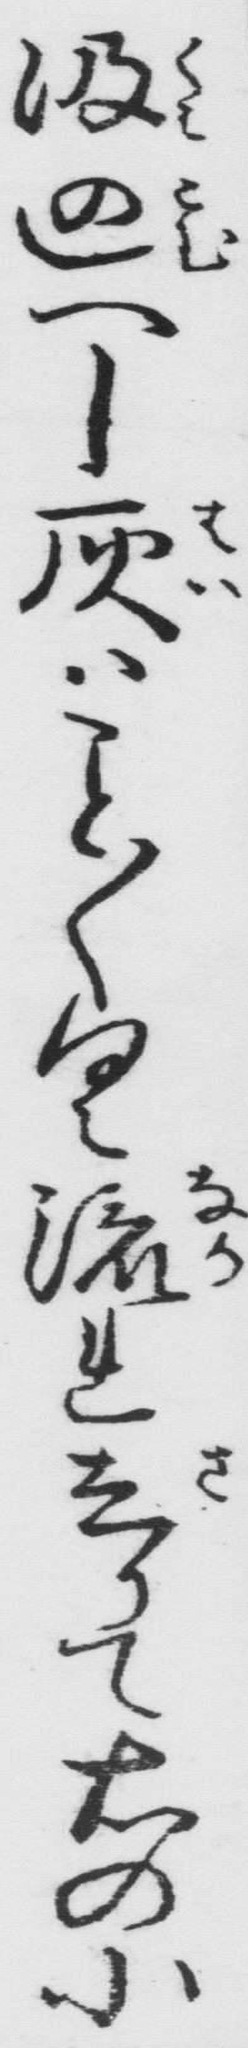汲込へし灰はこと〳〵く流れ去りて右の小
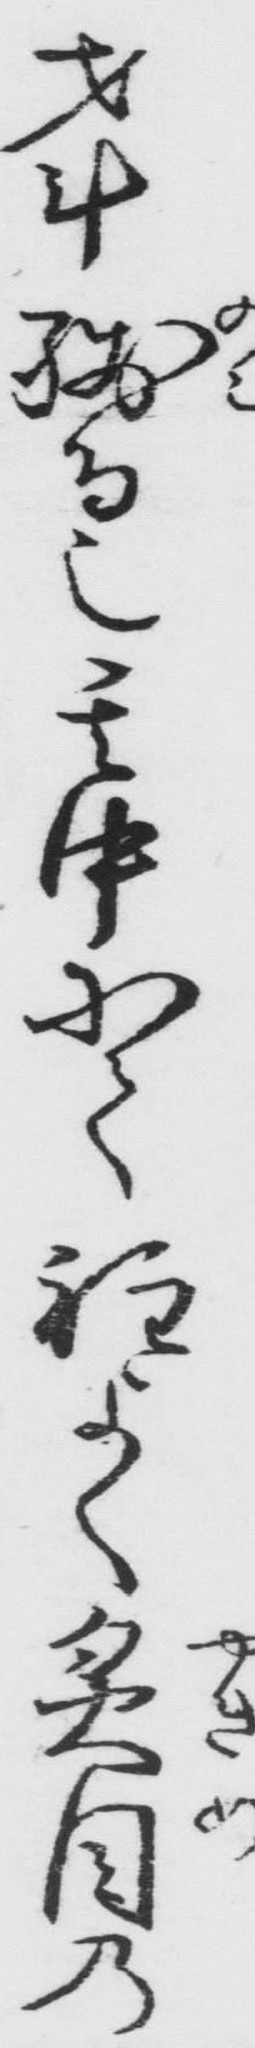才斗残る也其中にて程よく炙目の
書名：海鰻百珍
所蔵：大阪府立大学学術情報センター 国文学研究資料館
